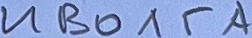иволга
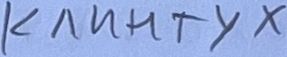клинтух
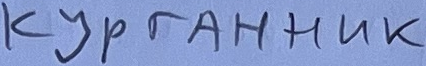курганник
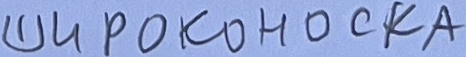широконоска
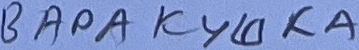варакушка
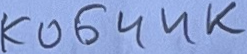кобчик
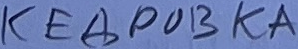кедровка
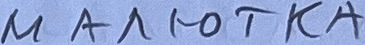малютка
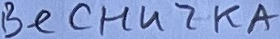весничка
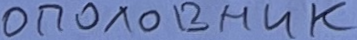ополовник
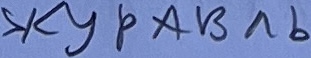журавль
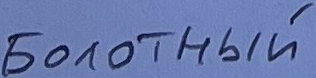болотный
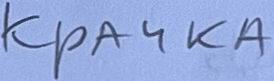крачка
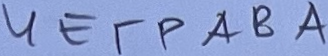чеграва
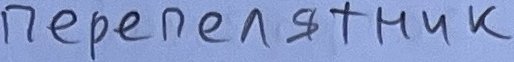перепелятник
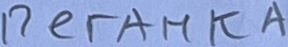пеганка
